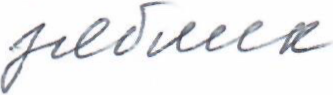зяблик
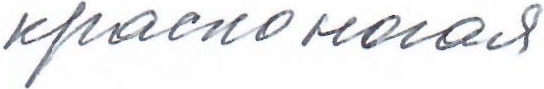красноногая
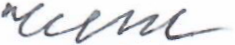чиж
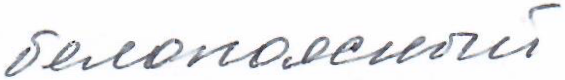белопоясный
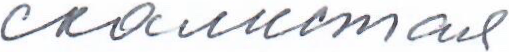скалистая
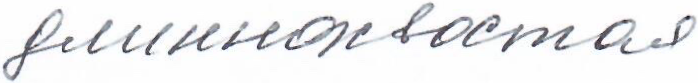длиннохвостая
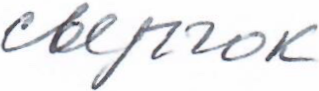сверчок
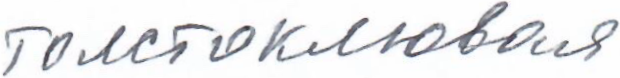толстоклювая
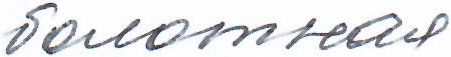болотная
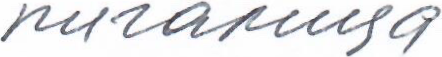пигалица
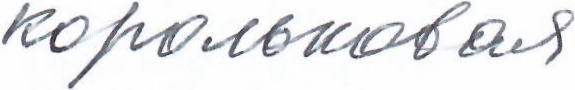корольковая
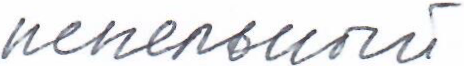пепельный
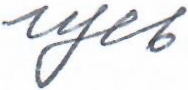гусь
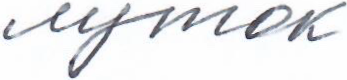луток
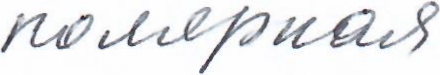полярная
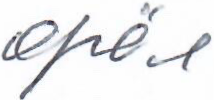орёл
